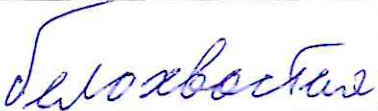белохвостая
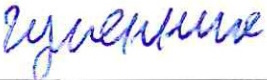гуменник
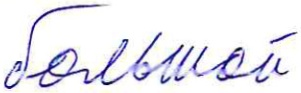большой
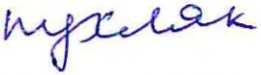пухляк
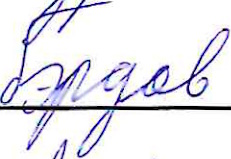бэрдов
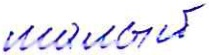малый
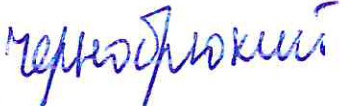чернобрюхий
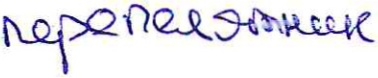перепелятник
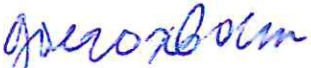долгохвост
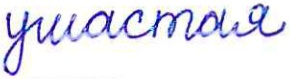ушастая
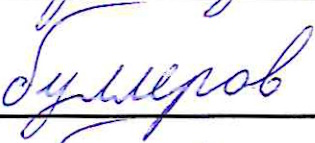буллеров
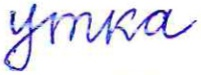утка
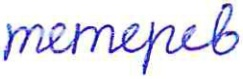тетерев
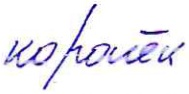королёк
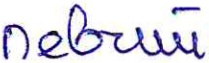певчий
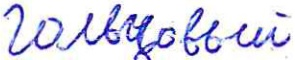гольцовый
